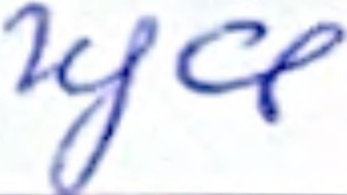гусь
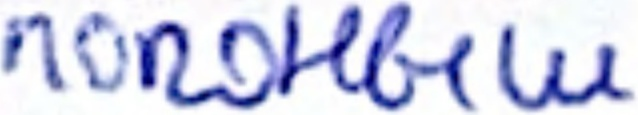погоныш
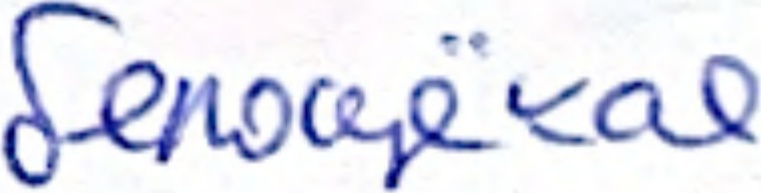белощёкая
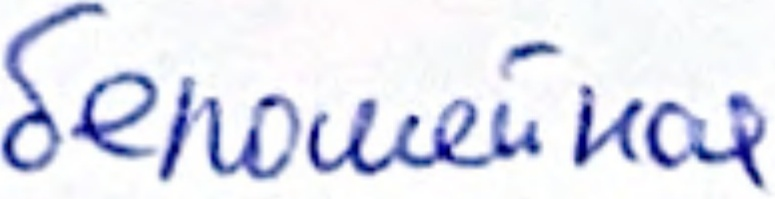белошейная
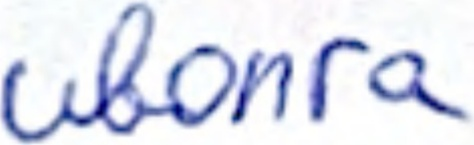иволга
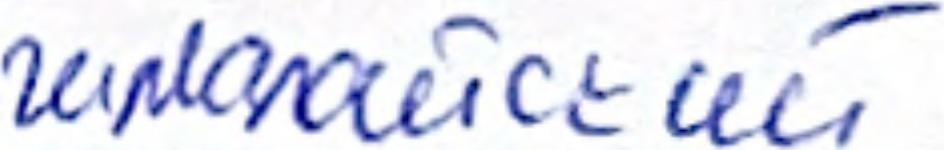гималайский
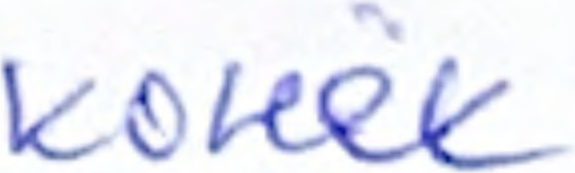конёк
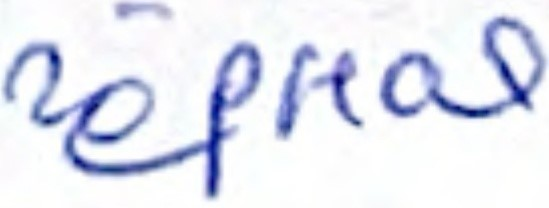чёрная
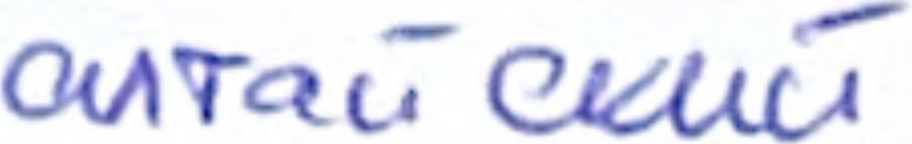алтай ский
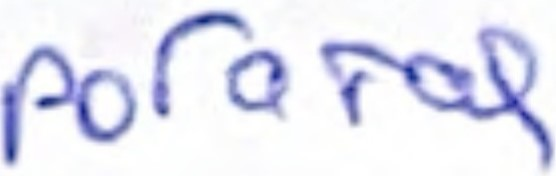рогатая
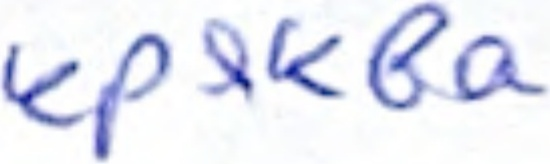кряква
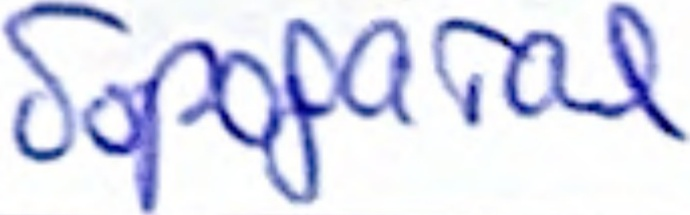бородатая
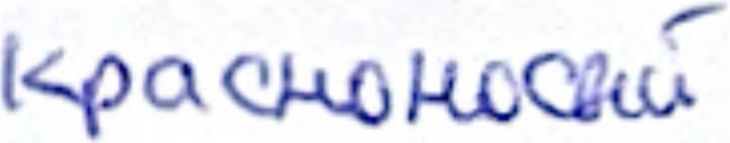красноносый
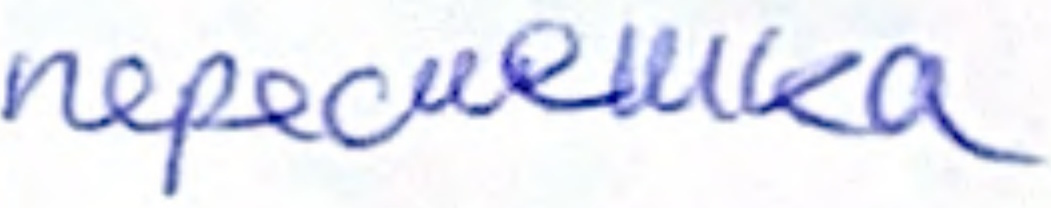пересмешка
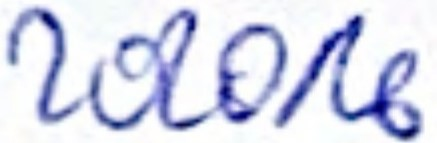гаоль
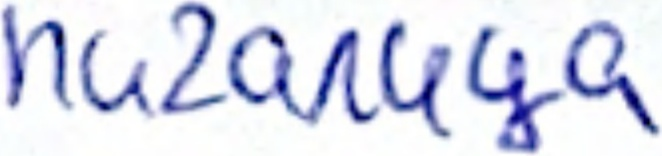пигалица
